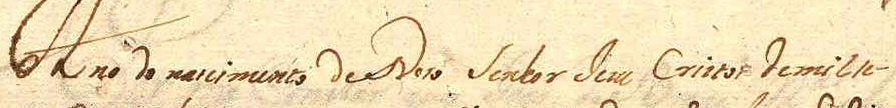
Ano do nascimento de Noso Senhor Iesu Cristos de mil se
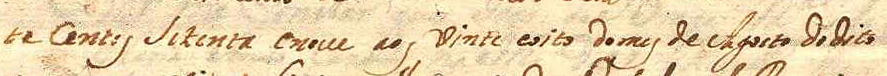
teCentos setenta e noue aos vinte e oito do mes de Agosto do dito
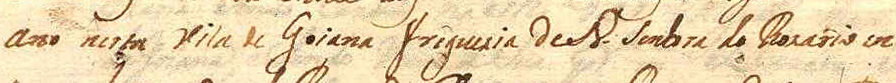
ano nesta Vila de Goiana freguezia de N. Senhora do Rozario en
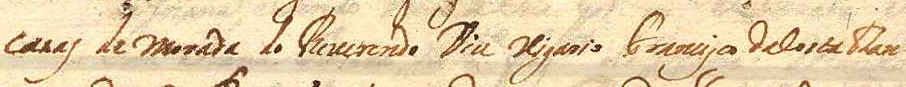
cazas de morada do Reuerendo Vice Vigario Francisco da Costa Ban
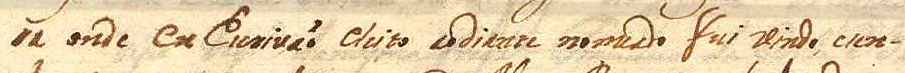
ra onde eu Escrivaõ eleito aodiante nomeado fui vindo, e sen
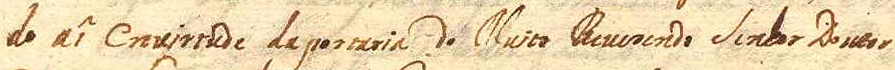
do aî en virtude da portaria do Muito Reuerendo Senhor Doutor
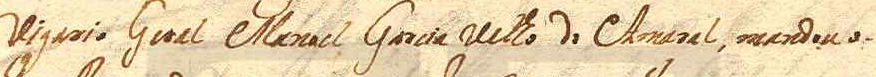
Vigario Geral Manoel Garcia Velho do Amaral, mandou o
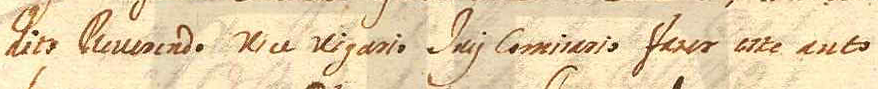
dito Reuerendo vice vigario Iuis Comisario fazer este auto
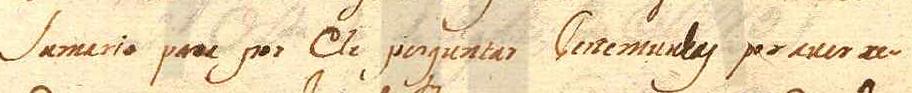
Sumario para por Ele perguntar Testemunhas por auer xe
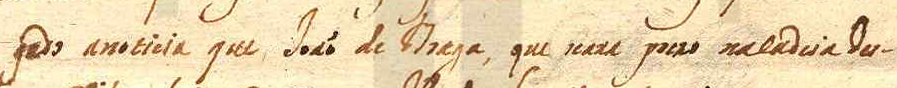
gado a noticia que Ioaõ de Braga, que seaxa prezo na cadeia des
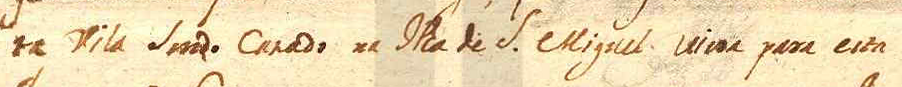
ta Vila sendo Cazado na Ilha de S. Miguel viera para esta
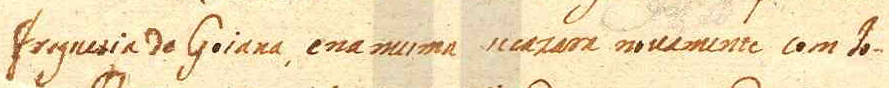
freguesia do Goiana, e na mesma secazara nouamente com Io
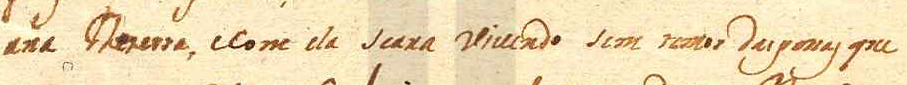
ana Thezerra, e com ela seaxa vivendo sem temor das penas que
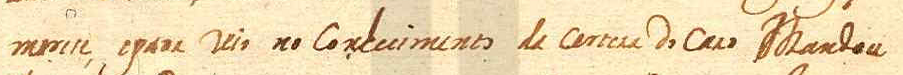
merese, e para vir no Conhecimento da certeza do Cazo Mandou
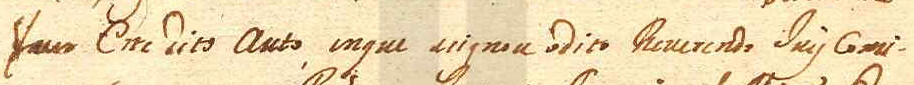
fazer Este dito Auto, en que asignou o dito Reuerendo Iuis Comi
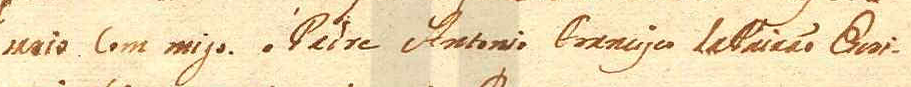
ssario Commigo. o Padre Antonio Francisco da Paixão Escri
